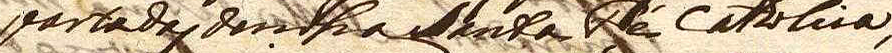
partadas de nossa Santa Fé Catholica,
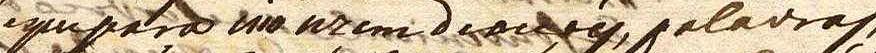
e que para isso uzem de acçoẽs, palavras,
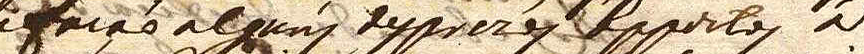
e façaõ alguñs desprezos oppostos á
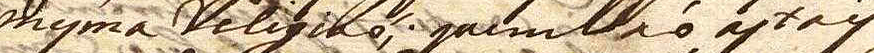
mesma Religiaõ, quem saõ as tais
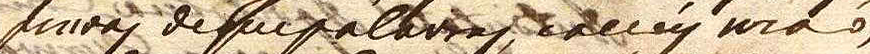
pessoas de que palavras, e acçoẽs uzaõ,
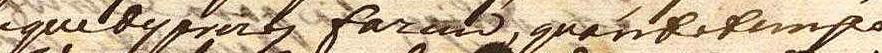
e que desprezos fazem, quanto tempo
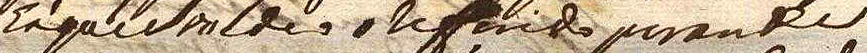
há que svssede o Refferido perante
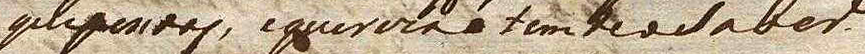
que pessoas, e que rezaõ tem de o Saber.
